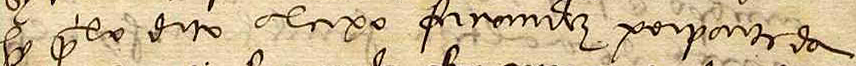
hy p̄lo dito aleixo fernandez por parte da
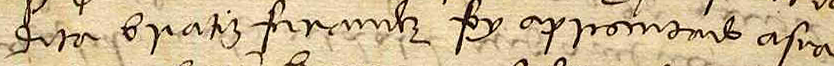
dita briatiz fernandez foy apresentado a sua
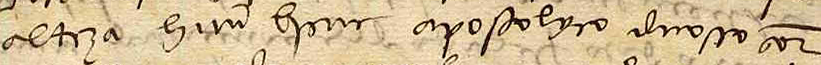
alteza huū breue apostolyco de nosso s̄or
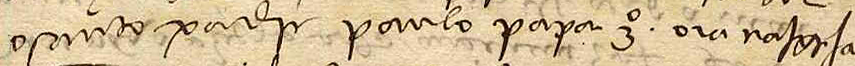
o santo padre paulo papa 3o. ora na JgreJa
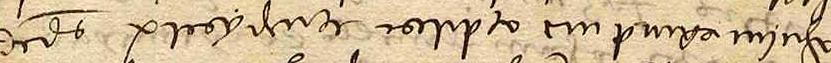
de d̄s presydente escripto em purgamjnho
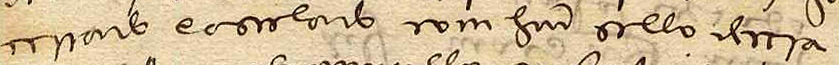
cerrado e aseelado com huū sello de çera
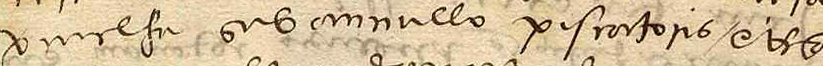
ꝟmelha sub annullo piscatoris / e Req̄
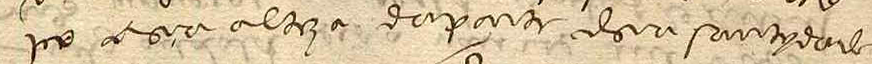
reo a sua alteza da parte de sua santydade
